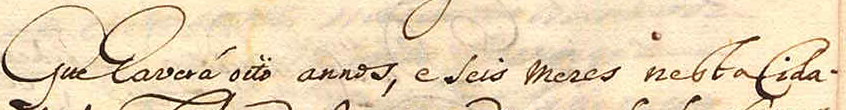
Que haverá oito annos, e seis mezes nesta Cida
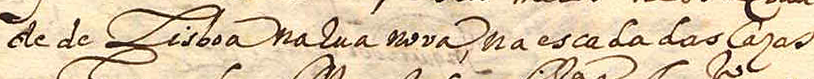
de de Lisboa na Rua nova, na escada das Cazas
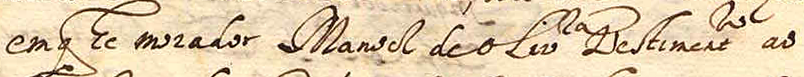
em q̄ he morador Manoel de oLivra Vestiment.ro ao
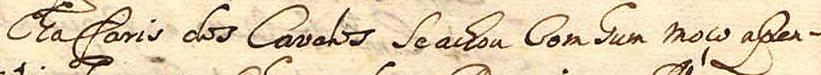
Chafaris dos Cavalos se achou Com hum moço apren
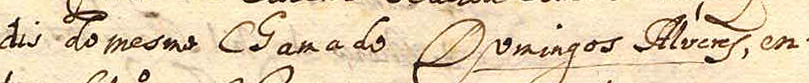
dis do mesmo Chamado Domingos Alveres, en
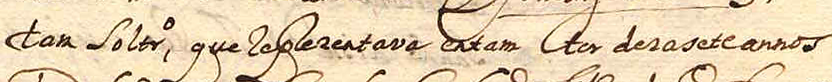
tam soltro, que Reprezentava entam ter dezasete annos
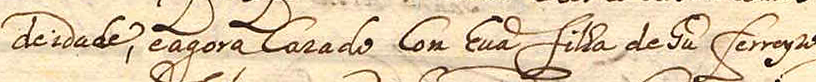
de idade, e agora cazado Com huā filha de hū ferreyro
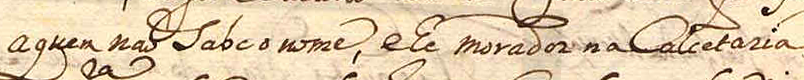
a quem naõ sabe o nome, e he morador na Calcetaria
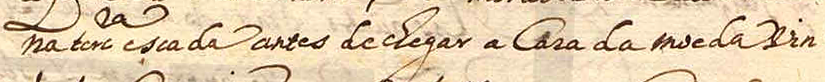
na tercra escada antes de chegar a Caza da moeda Vin
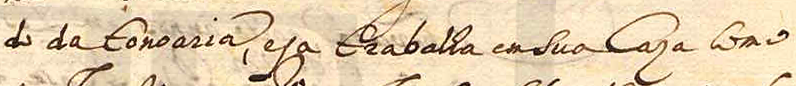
do da tonoaria, e ja trabalha em sua Caza com o
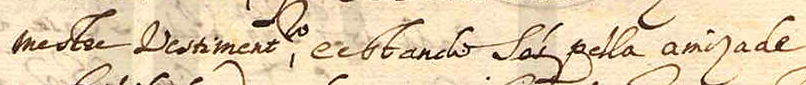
meste Vestimentro, e estando sós pella amizade
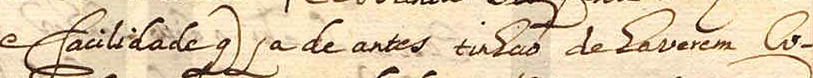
e facilidade q̄ ja de antes tinhaõ de haverem, Co
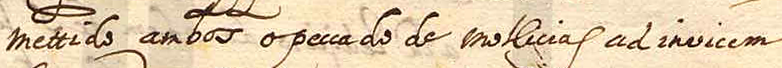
mettido ambos o peccado de mollicias ad invicem
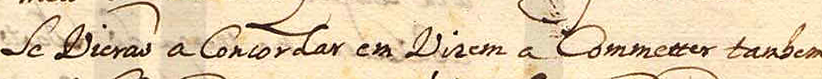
Se Vieraõ a Concordar em Virem a Commetter tambem
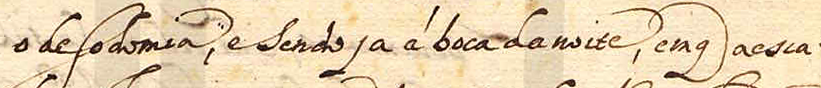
o de sodomia, e sendo ja á boca da noite, em q̄ a esca
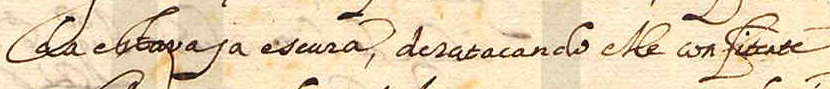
da estava ja escura, dezatacando elle confitente
